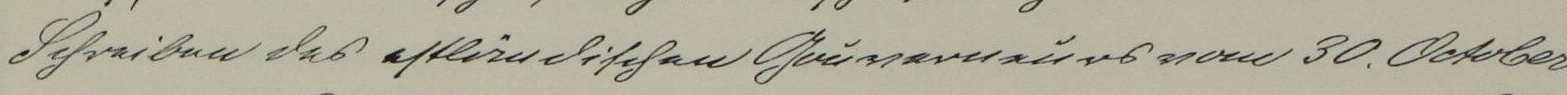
Schreiben des estländischen Gouverneurs vom 30. October
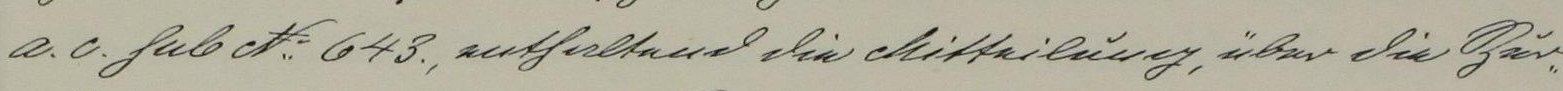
a.c. sub No. 643., enthaltend die Mitteilung, über die Zur-
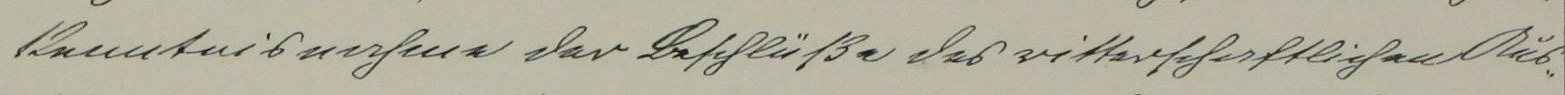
kenntnisnahme der Beschlüße des ritterschaftlichen Aus-
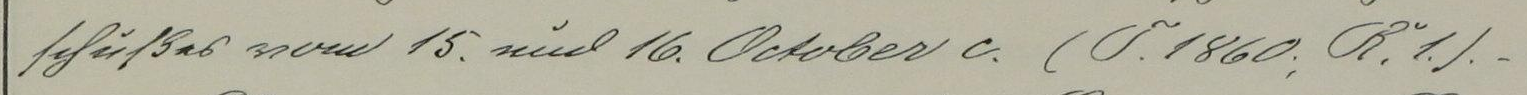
schußes vom 15. und 16. October c. (T.1860; R.1).
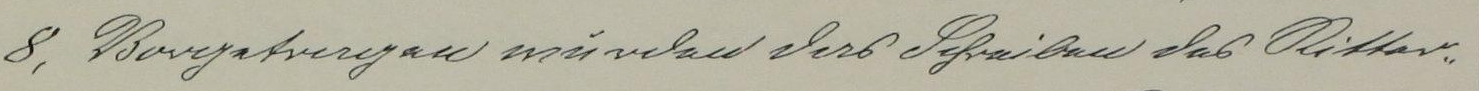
8. Vorgetragen wurden das Schreiben des Ritter-
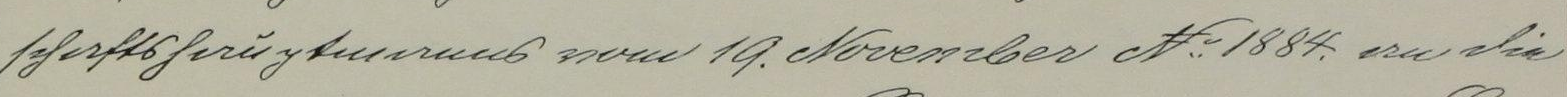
schaftshauptmanns vom 19. November No. 1884. an die
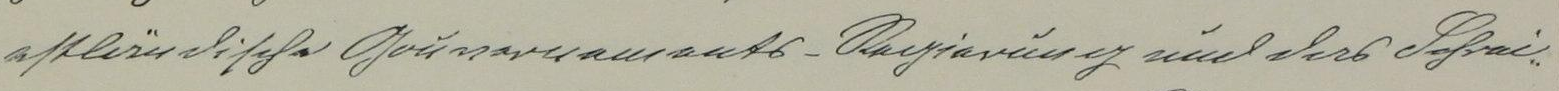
estländische Gouvernements-Regierung und das Schrei-
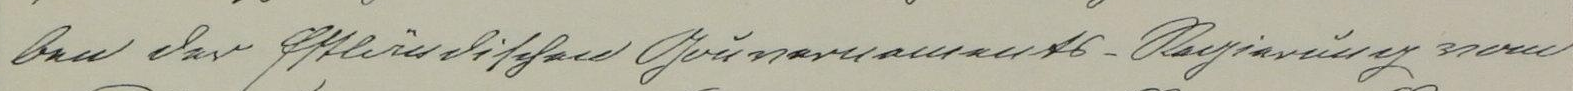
ben der Estländischen Gouvernements-Regierung vom
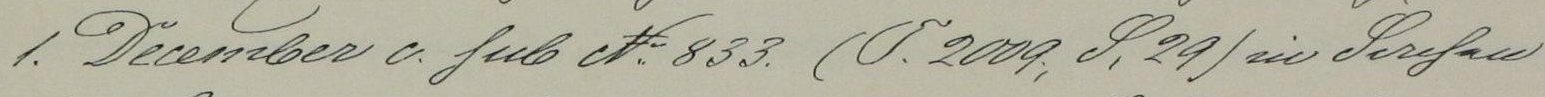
1. December c. sub No. 833. (T.2009; S.29) in Sachen
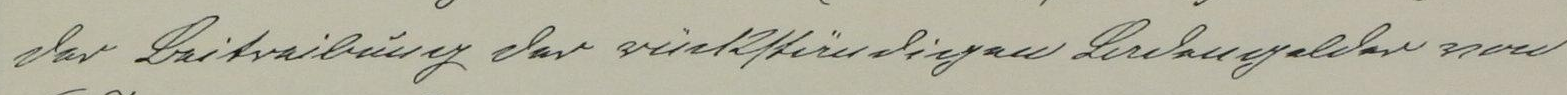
der Beitreibung der rückständigen Ladengelder von
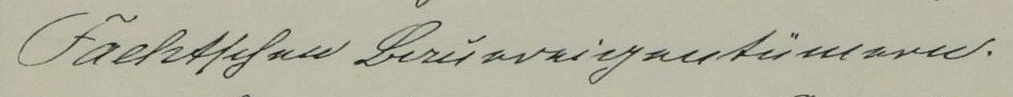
Faehtschen Bauereigentümern.
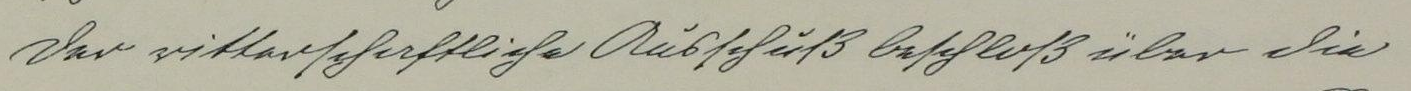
Der ritterschaftliche Ausschuß beschloß über die
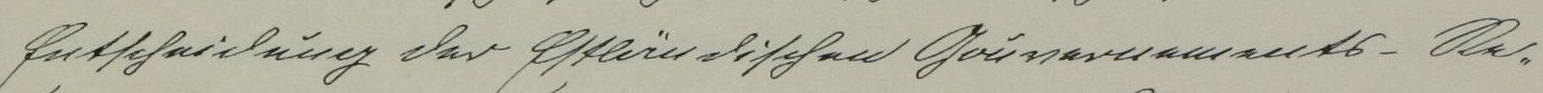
Entscheidung der Estländischen Gouvernements-Re-
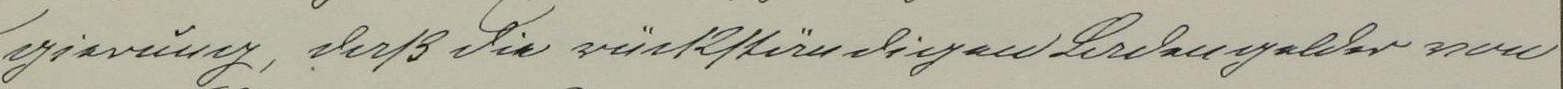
gierung, daß die rückständigen Ladengelder von
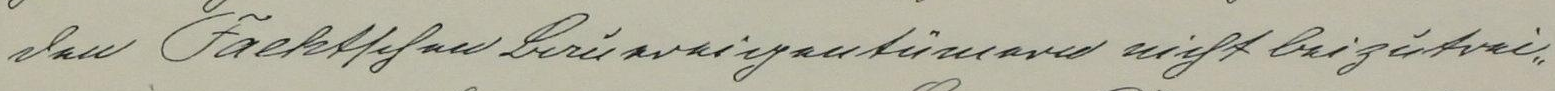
den Faehtschen Bauereigentümern nicht beizutrei-
